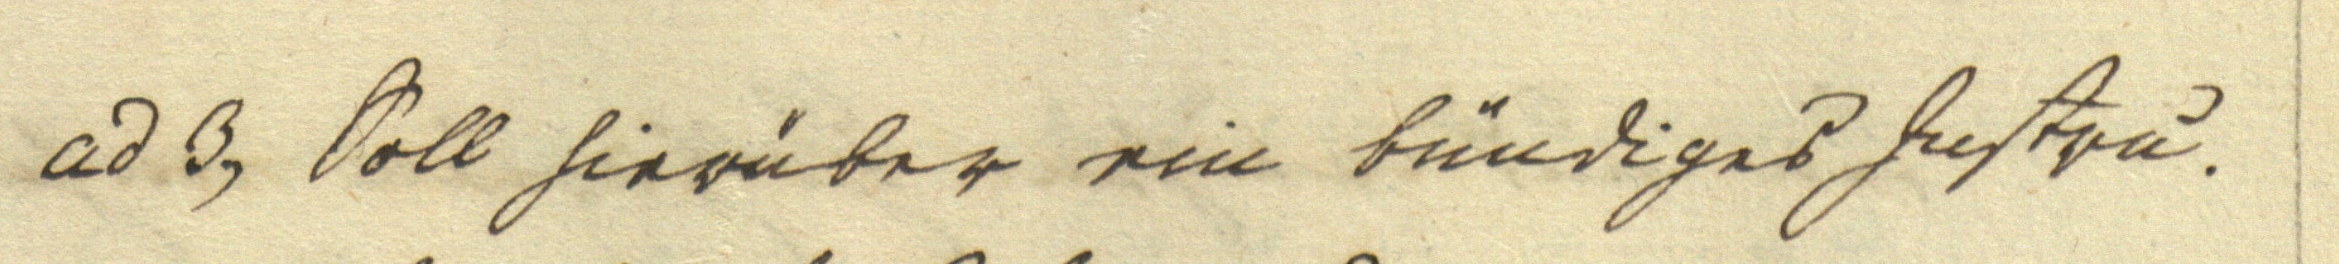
ad 3., soll hierüber ein bündiges Instru¬
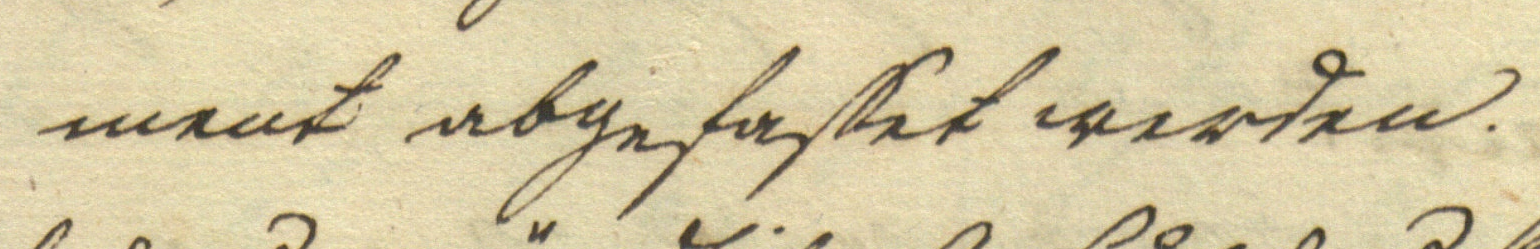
ment abgefasset werden.
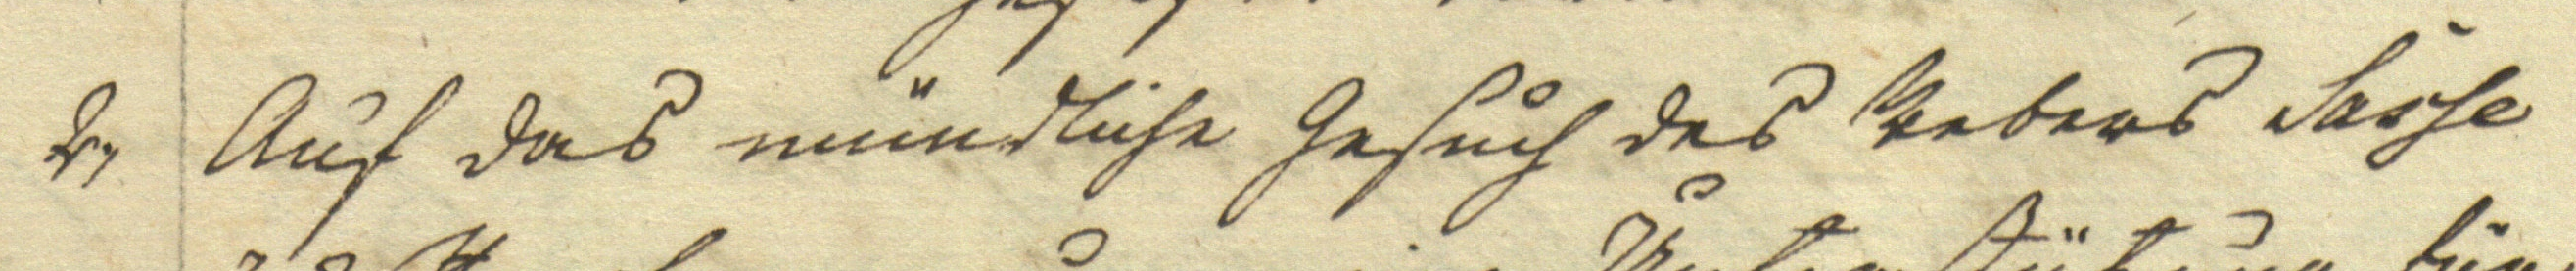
2., Auf das mündliche Gesuch des Webers Sasse
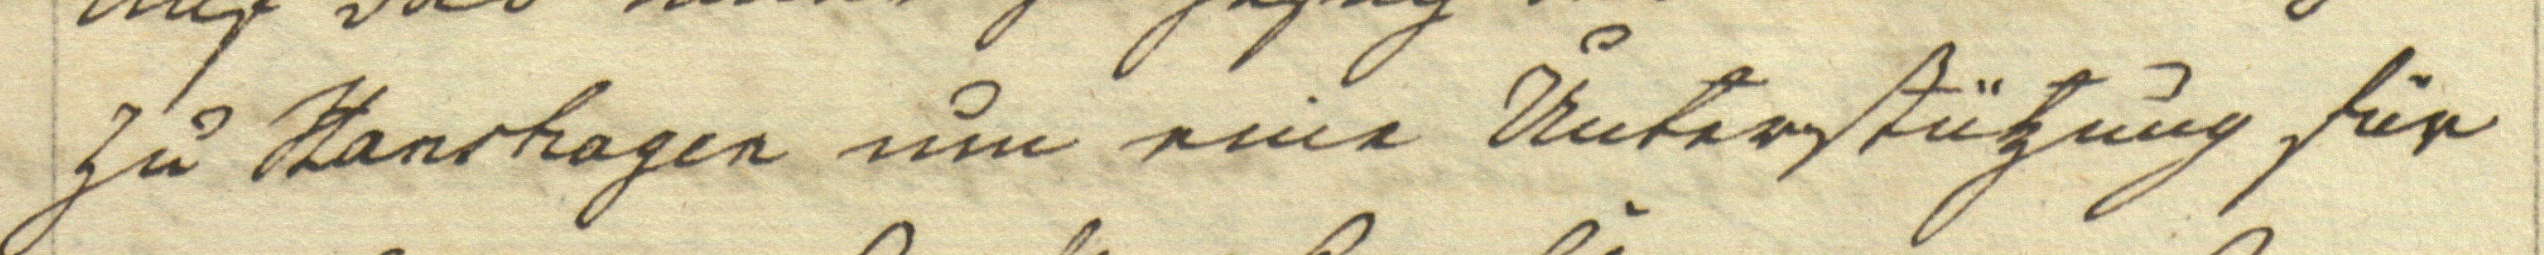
zu Hanshagen um eine Unterstützung für
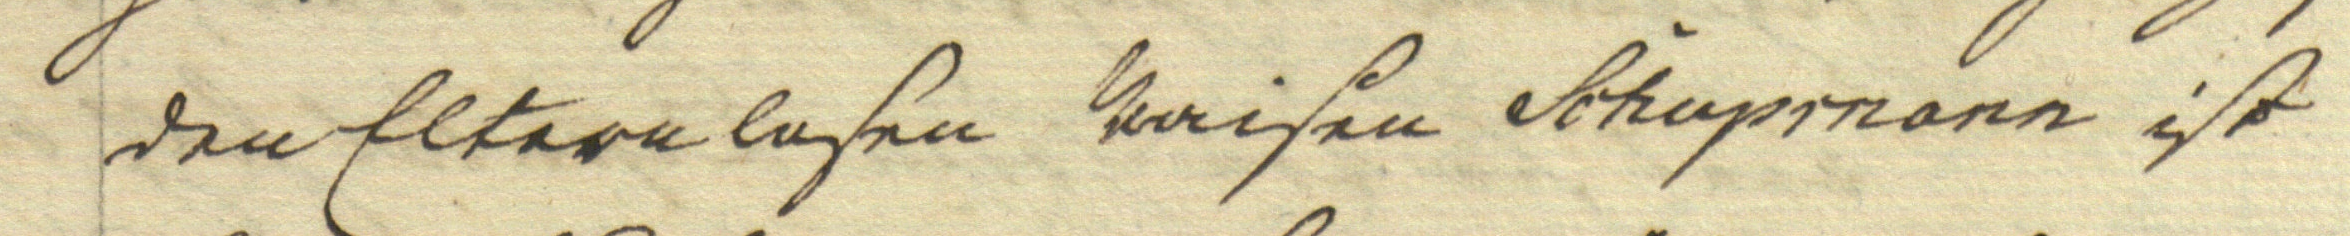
den Eltern losen Waisen Schupmann ist
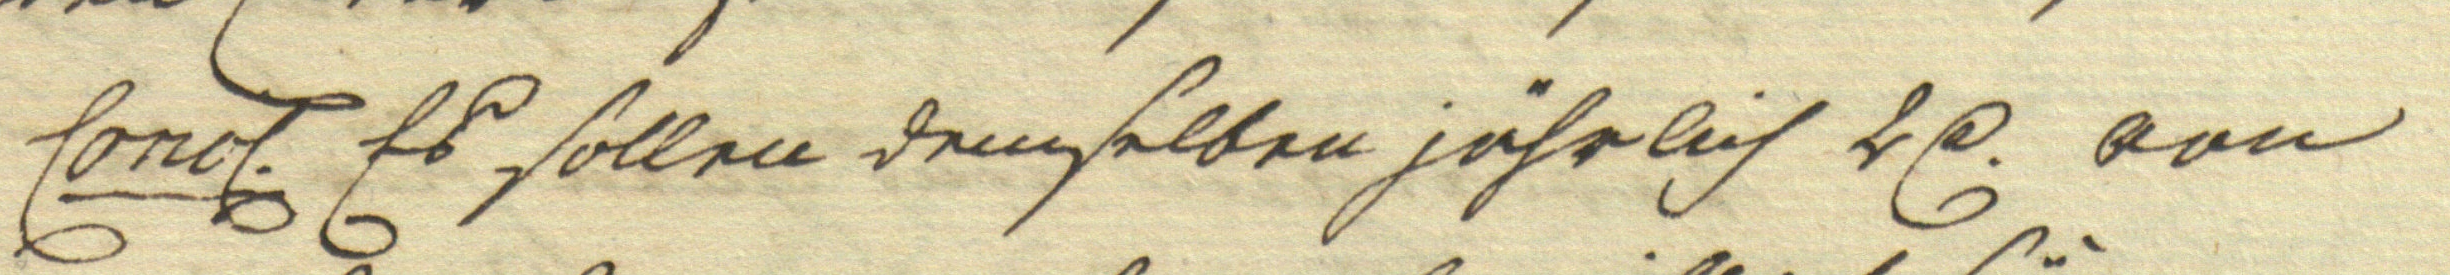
Concl. Es sollen demselben jährlich 2 l. von
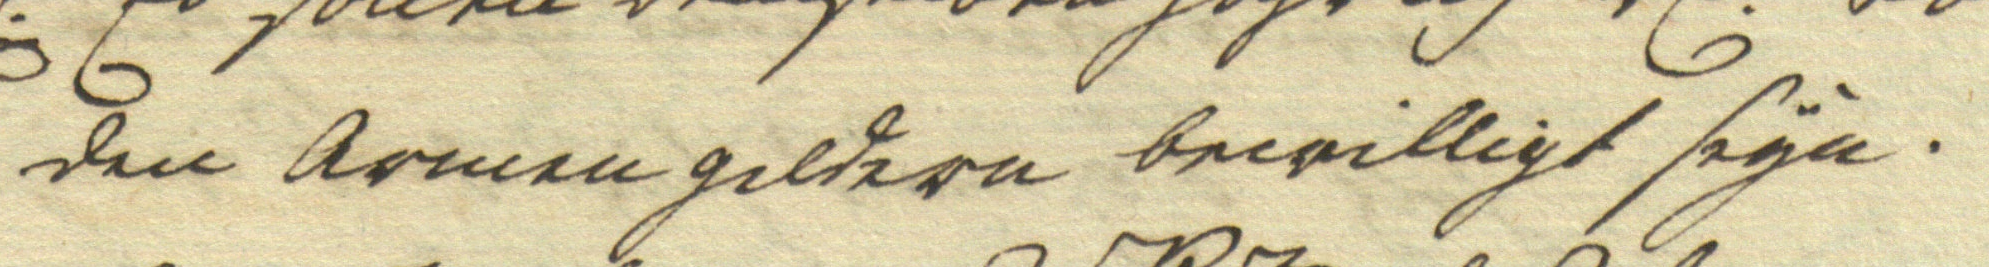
in Armengeldern bewilligt seÿn.
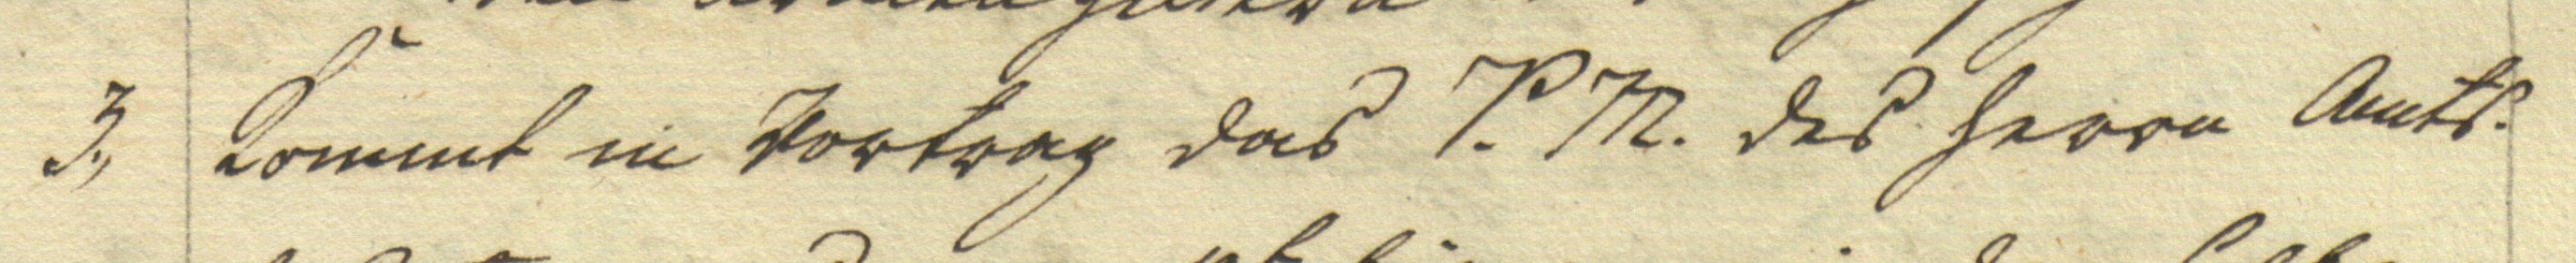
3. Kommt in Vortrag das P. M. des Herrn Amts¬
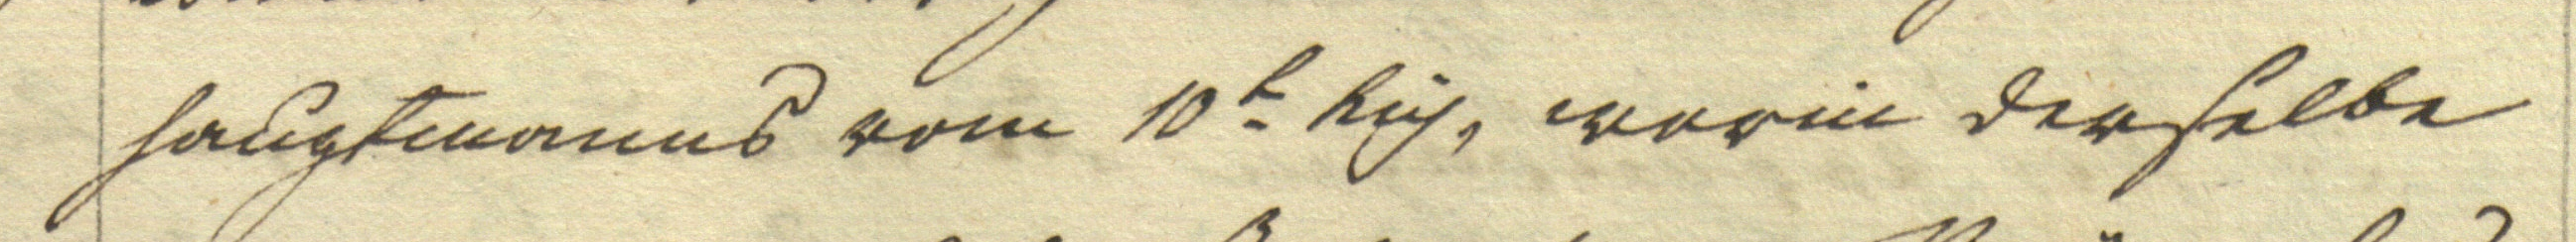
hauptmanns vom 10 t. huj., worin derselbe
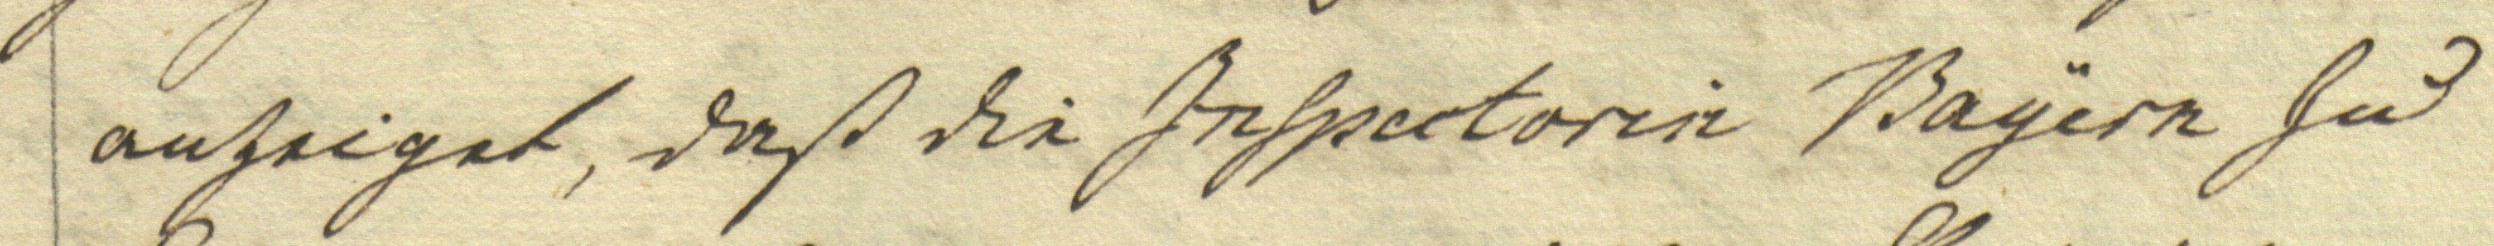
anzeiget, daß die Inspectorin Baÿern zu
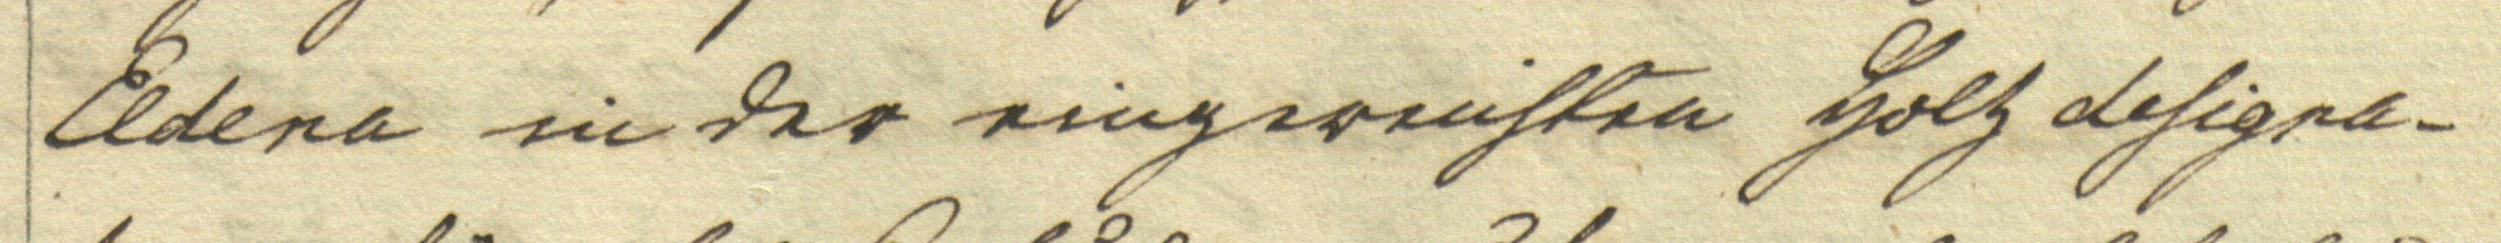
Eldena in der eingereichten Holz designa¬
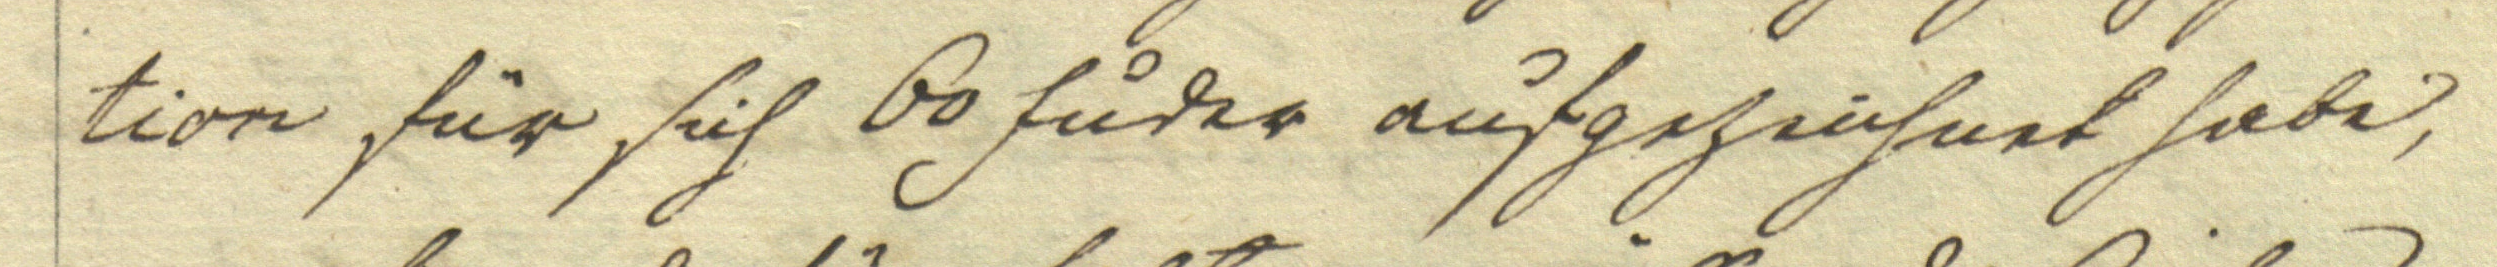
tion für sich 60 Fuder aufgezeichnet habe,
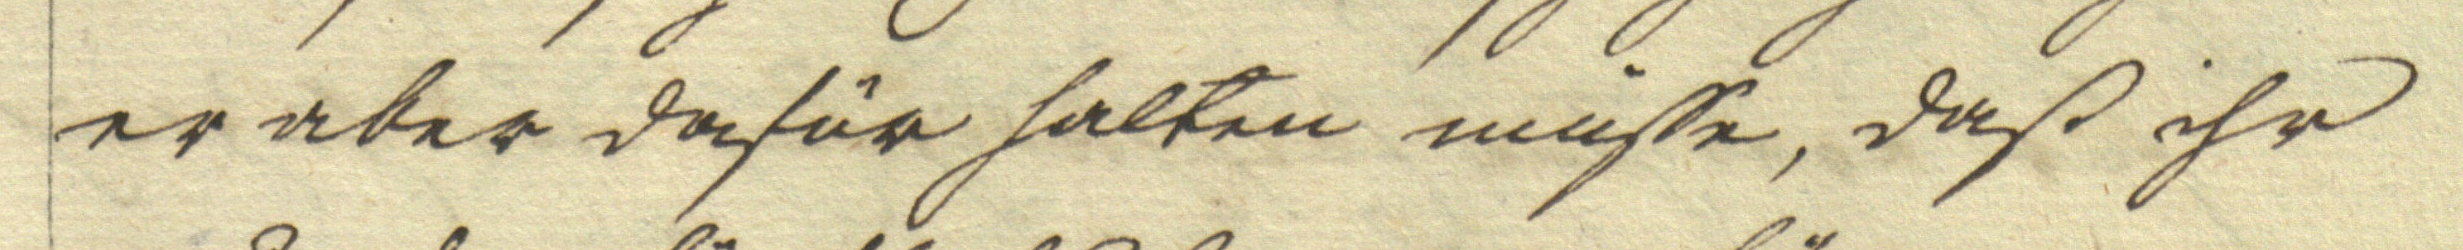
er aber dafür halten müsse, daß ihr
